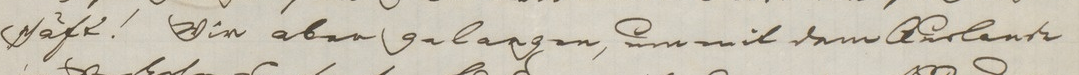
schäft! Wir aber gelangen, um mit dem Auslande
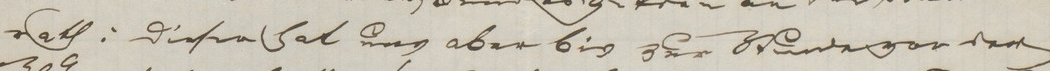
rath: dieser hat uns aber bis zur Stunde vor der
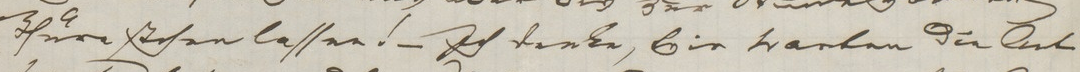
Thüre stehen lassen!– Ich denke, wir warten die Ant-
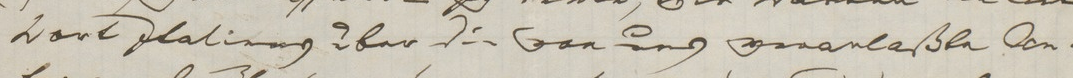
wort Italiens über die von uns veranlaßte An-
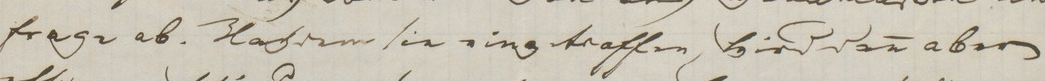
frage ab. Nachdem sie eingetroffen wird dann aber
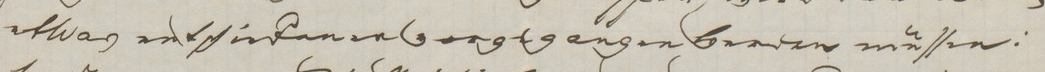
etwas entschiedener vorgegangen werden müssen:
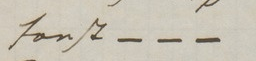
sonst – – –
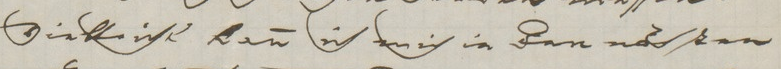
Vielleicht kann ich mich in den nächsten
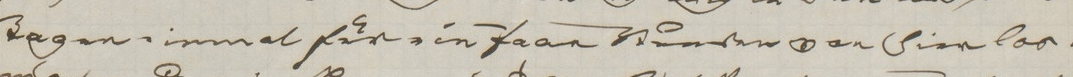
Tagen einmal für ein Paar Stunden von hier los-
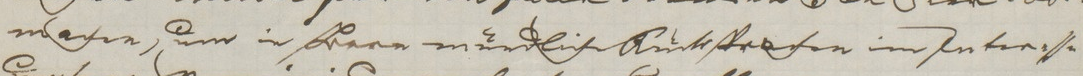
machen, um in Bern mündliche Rücksprachen im Interesse
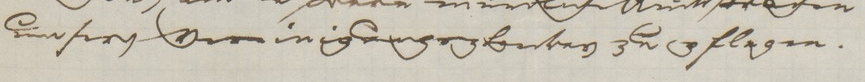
unsers Vereinigungszweckes zu pflegen.
